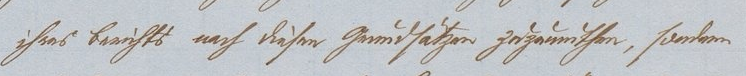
ihres Berichts nach diesen Grundsätzen zuzumuthen, sondern
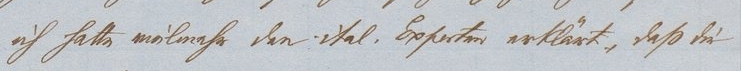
ich hatte vielmehr den ital. Experten erklärt, daß die
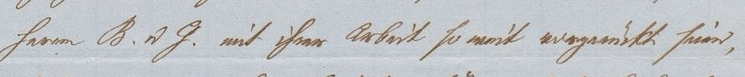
Herrn B. & G. mit ihrer Arbeit so weit vorgerückt seien,
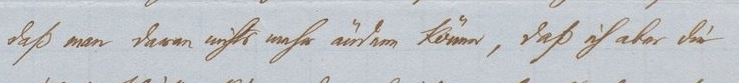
daß man daran nichts mehr ändern könne, daß ich aber die
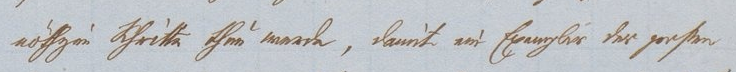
nöthigen Schritte thun werde, damit ein Exemplar der großen
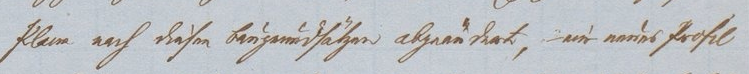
Plane nach diesen Baugrundsätzen abgeändert, ein neues Profil
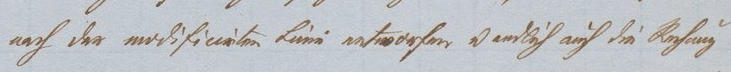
nach der modificirten Linie entworfen & endlich auch die Rechnung
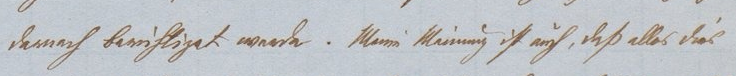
darnach berichtiget werde. Meine Meinung ist auch, daß alles dies
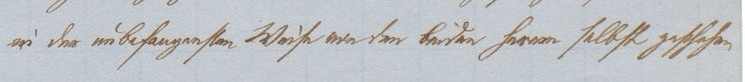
in der unbefangensten Weise von den beiden Herren selbst geschehen
